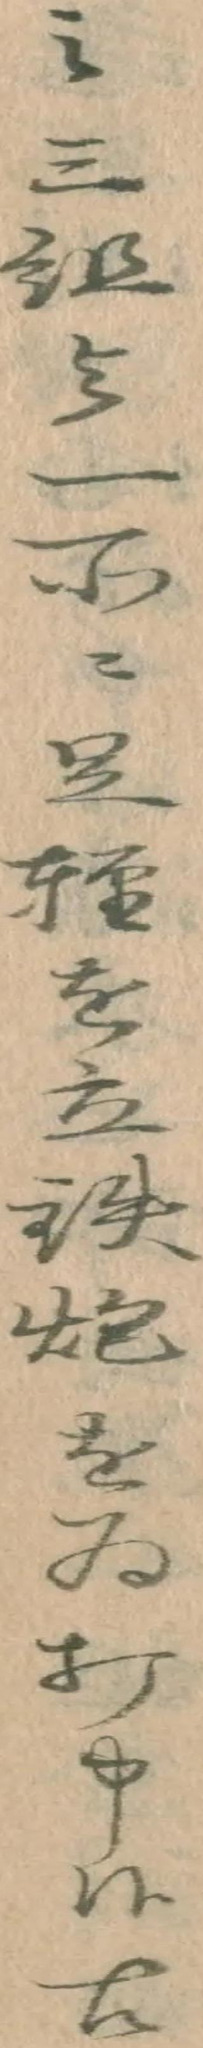之三組与一所に足軽を立鉄炮をゐ打申候古
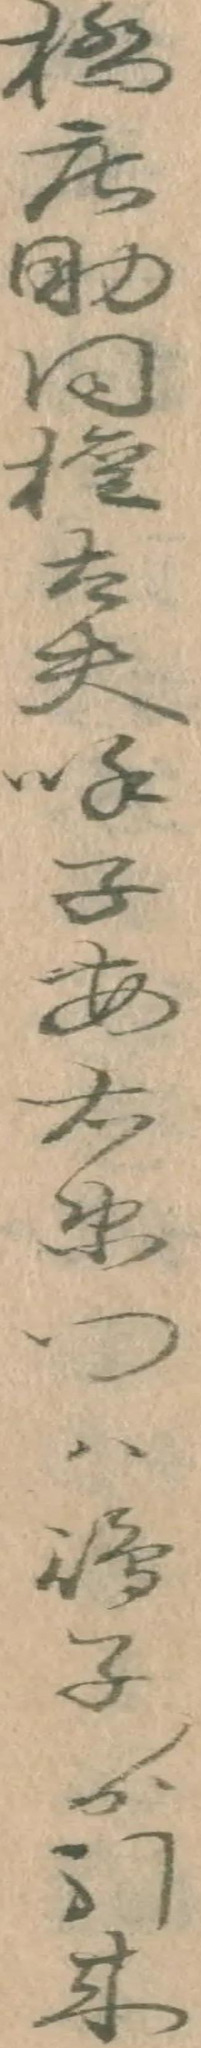橋庄助同権太夫呼子安右衛門は島子ゟ引来
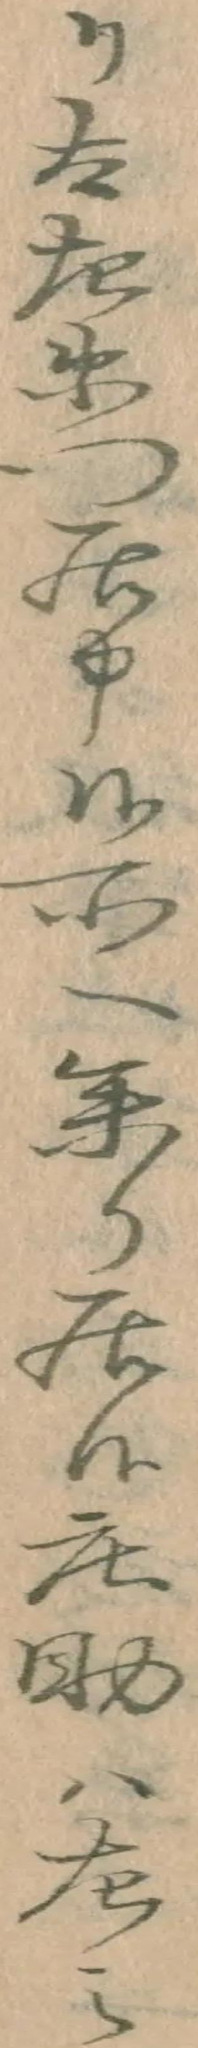り太左衛門居もう申候所へ参候庄助は左之
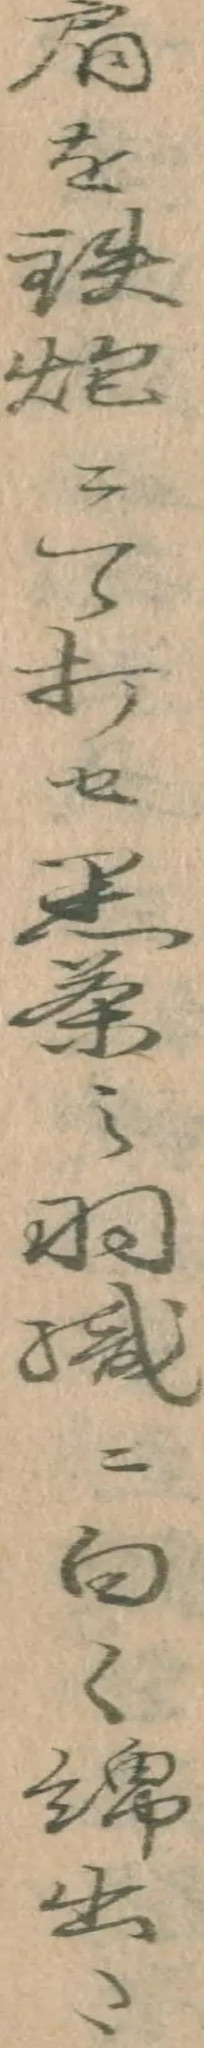肩を鉄炮にて打せ黒茶之羽織に白く綿出た
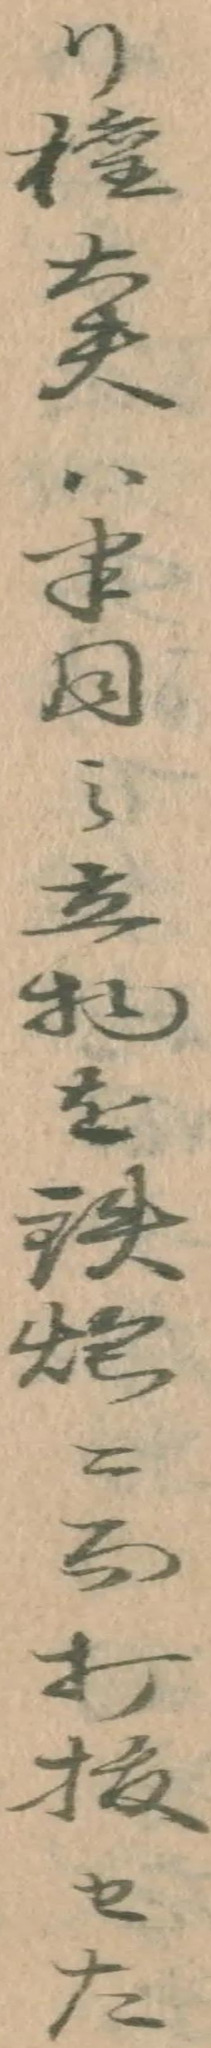り権大夫は半月之立物を鉄炮に而打抜せた
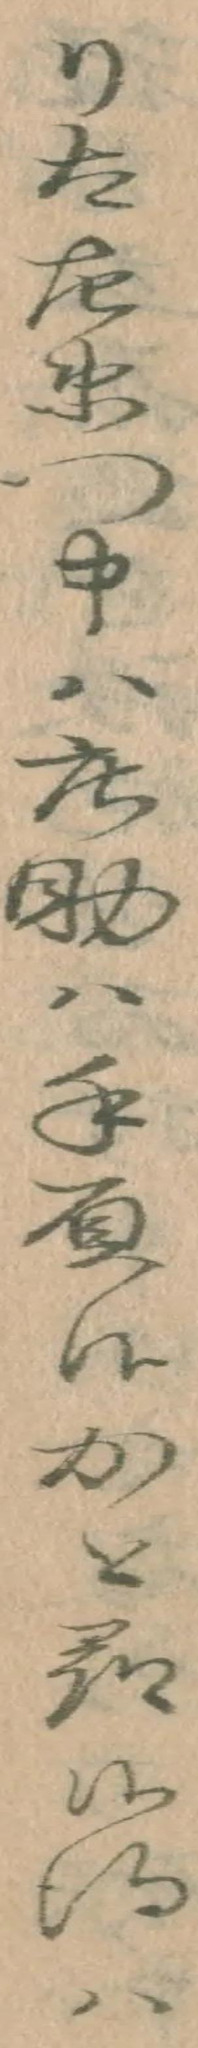り太左衛門申は庄助は手負候かと尋候得は
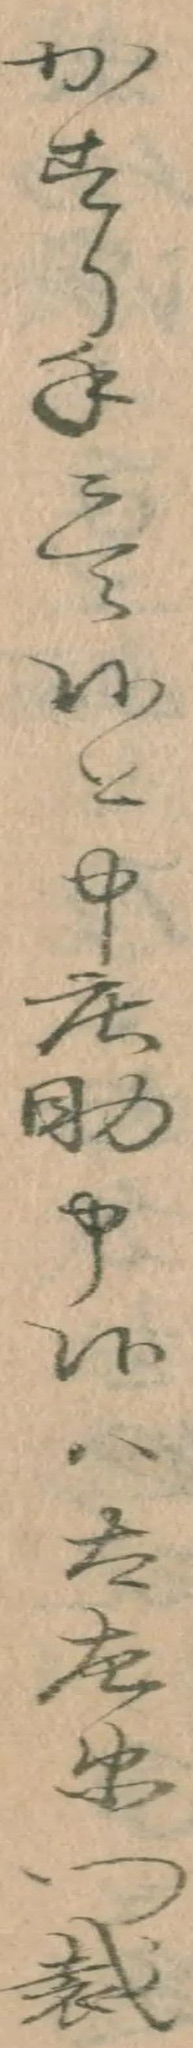か春り手にて候と申庄助申候は太左衛門裁
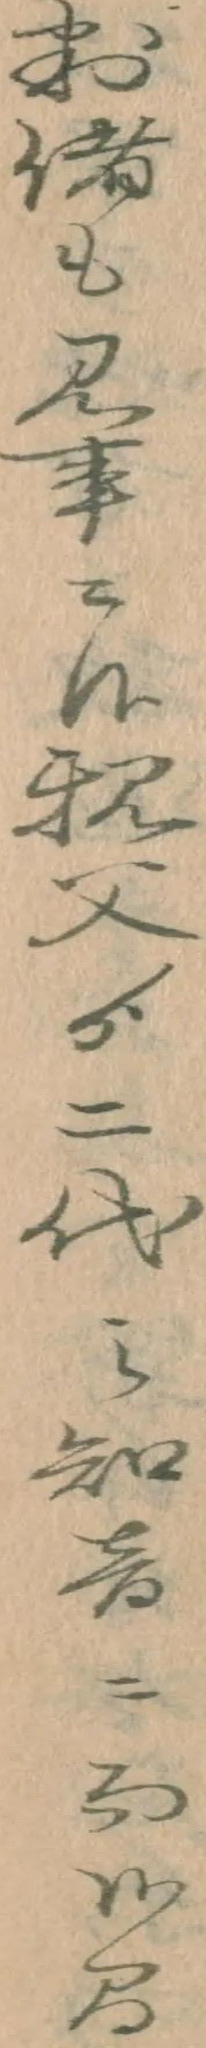判偖も見事に候親父ゟ二代之知音に而候間
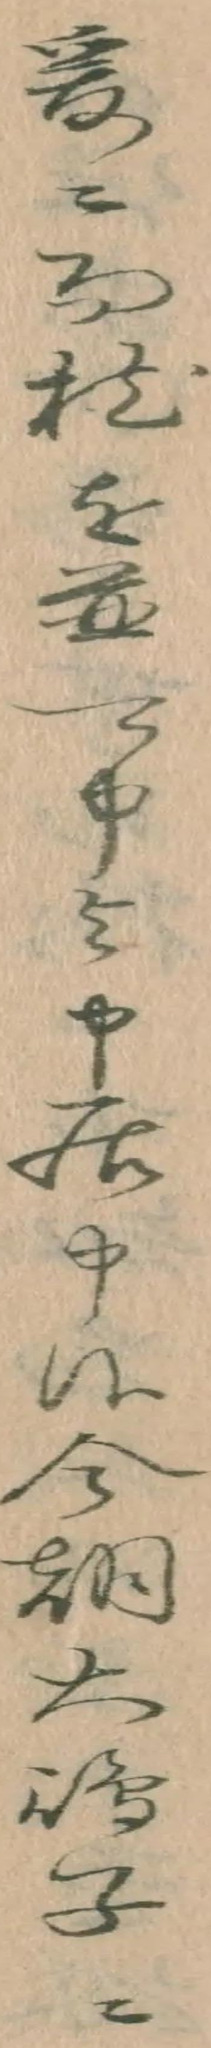爰に而枕を並可申与申居申候今朝大島子に
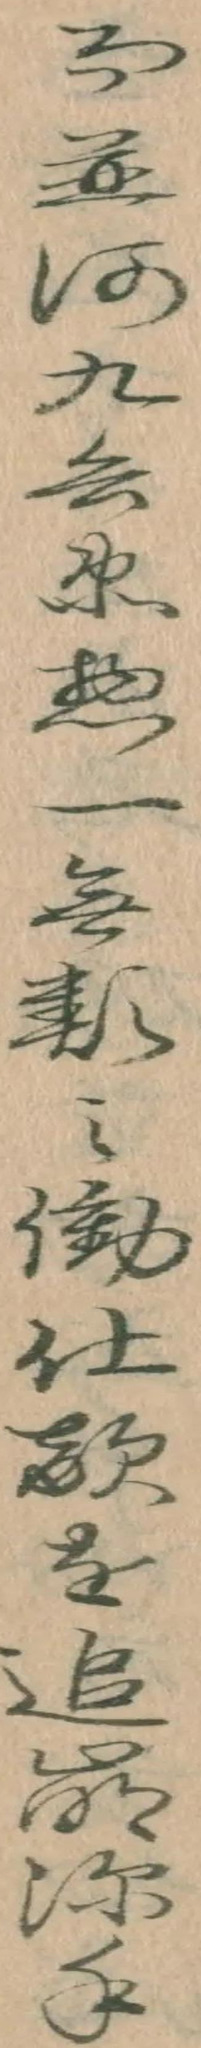而並河九兵衛惣一無類之働仕敵を追崩深手
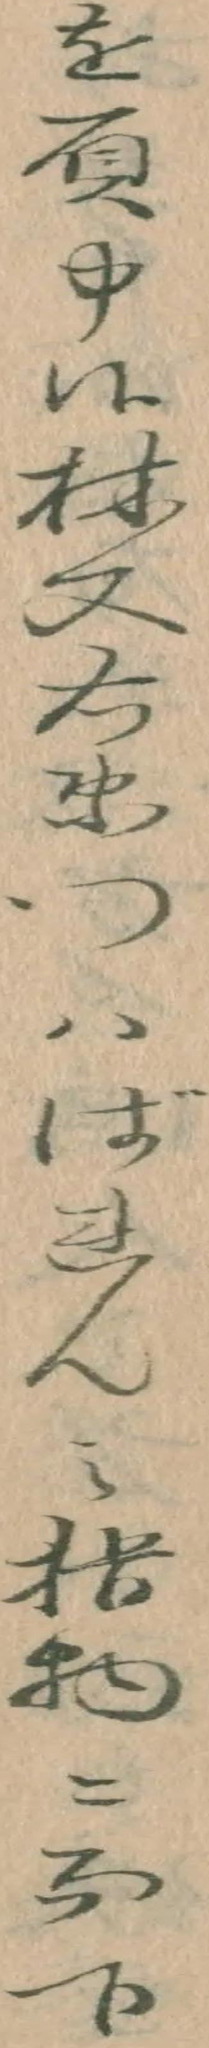を負申候林又右衛門はば連ん之指物に而下
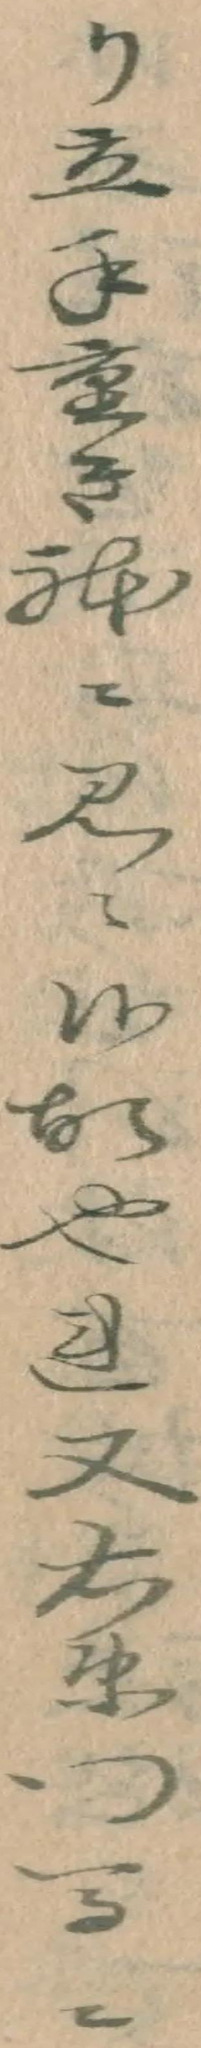り立手重き躰に見に候故や連又右衛門馬に
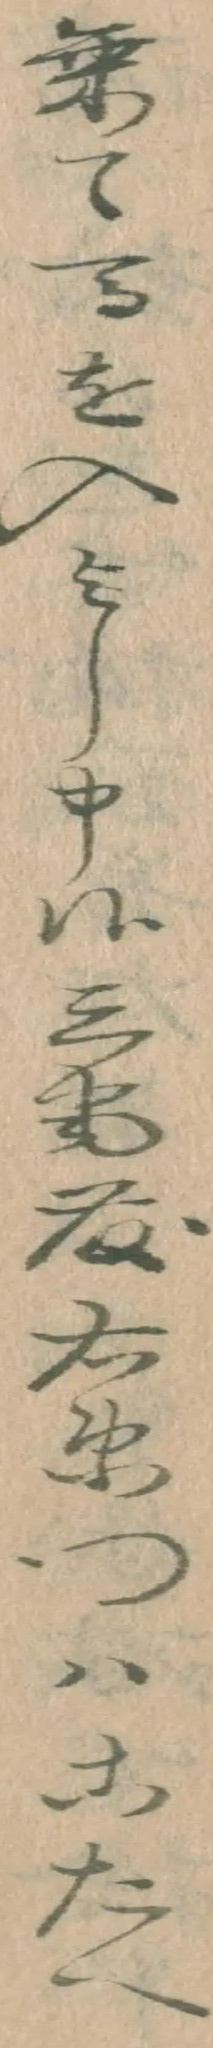乗て馬を入与し申候三宅藤右衛門は古たへ
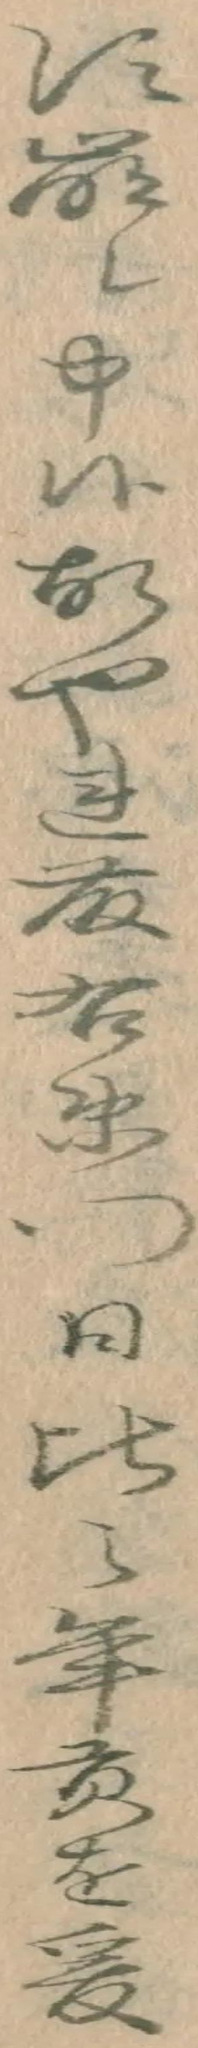須崩れ申候故や連藤右衛門日比之年貢を爰
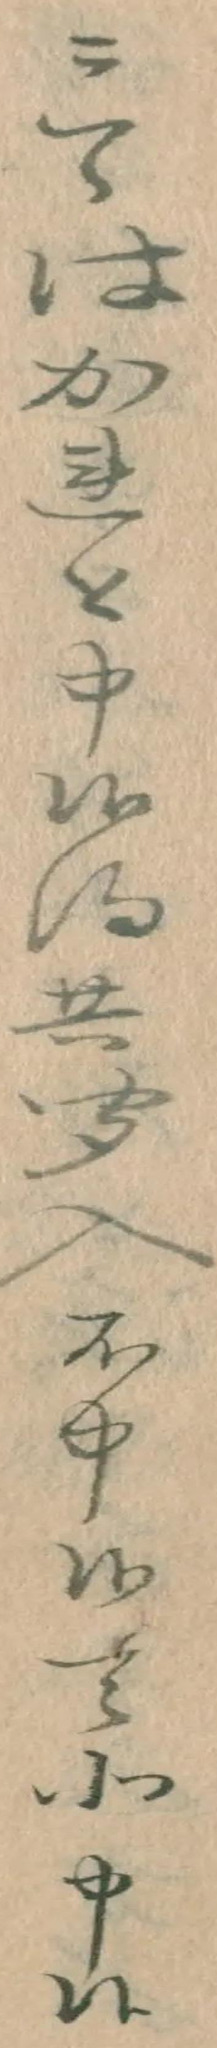にてはか連と申候得共聞入不申候其北申候
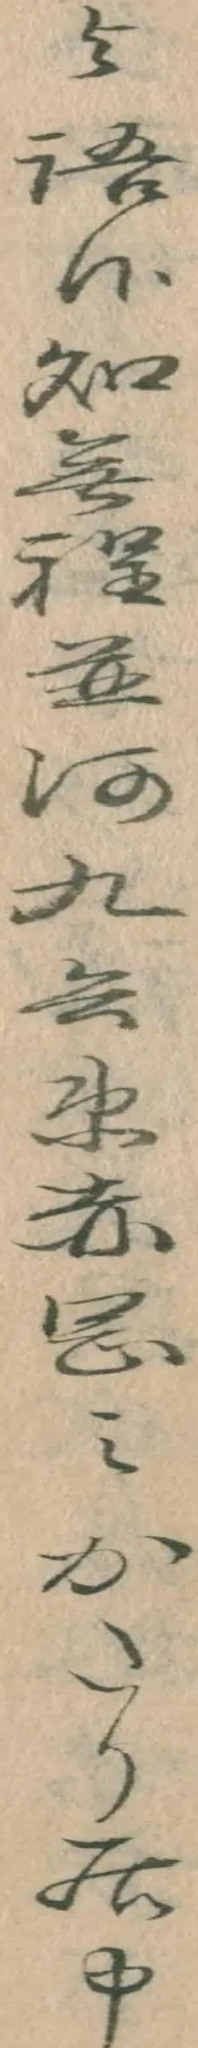与語候処無程並河九兵衛赤岡之かたり居申
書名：切支丹御退治記 49巻. [2]
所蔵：国立国会図書館 National Diet Library, JAPAN
